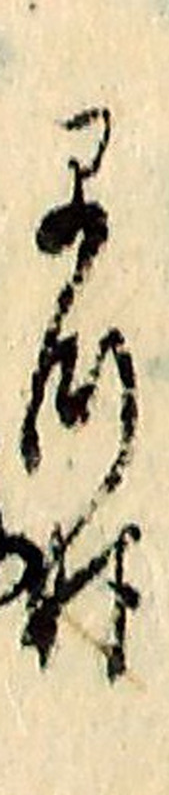早淵村
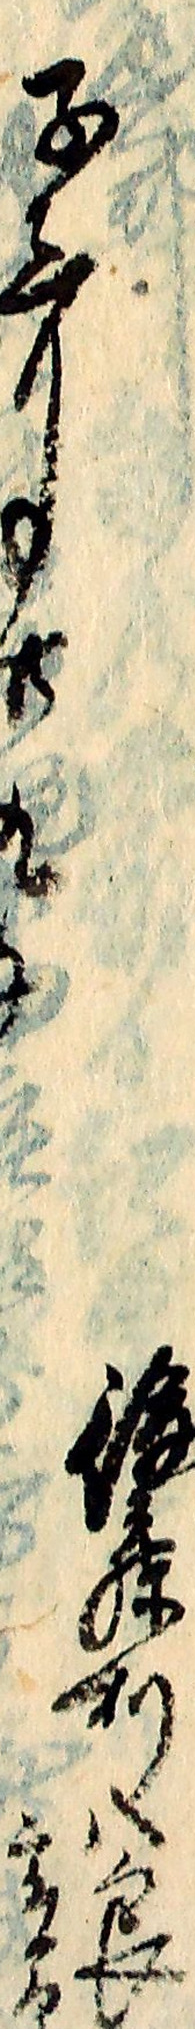子十一月廿九日
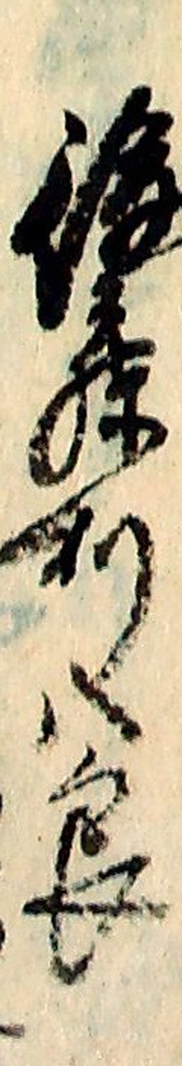後藤利八郎
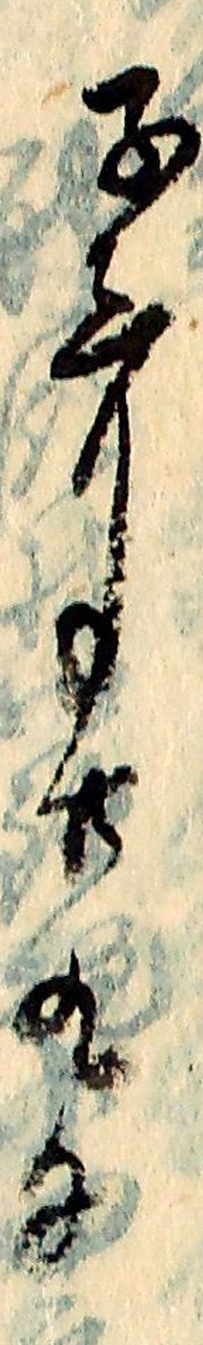子十一月廿九日

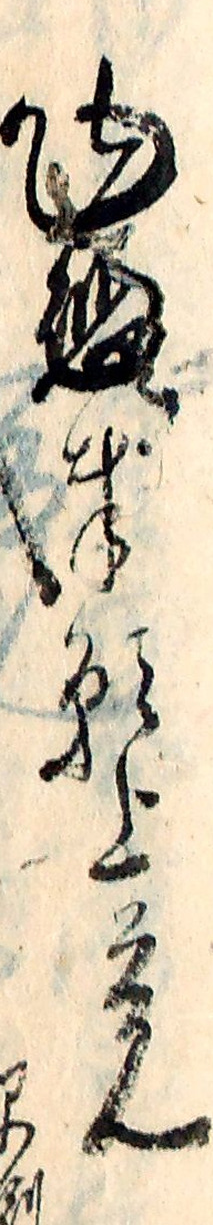乍恐奉願上覚
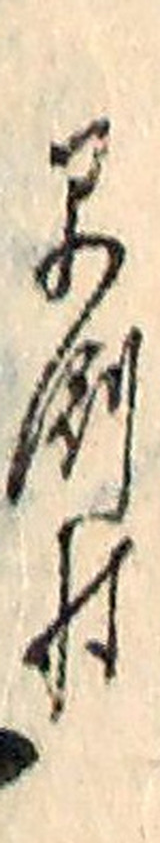早淵村
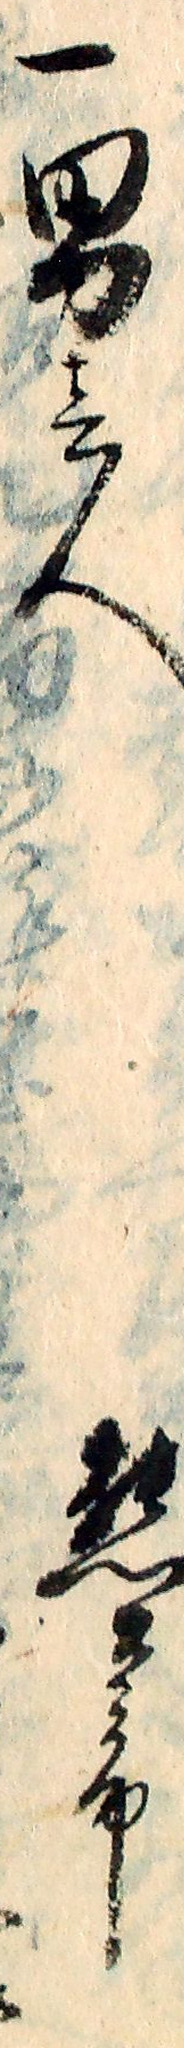一男壱人熊太郎
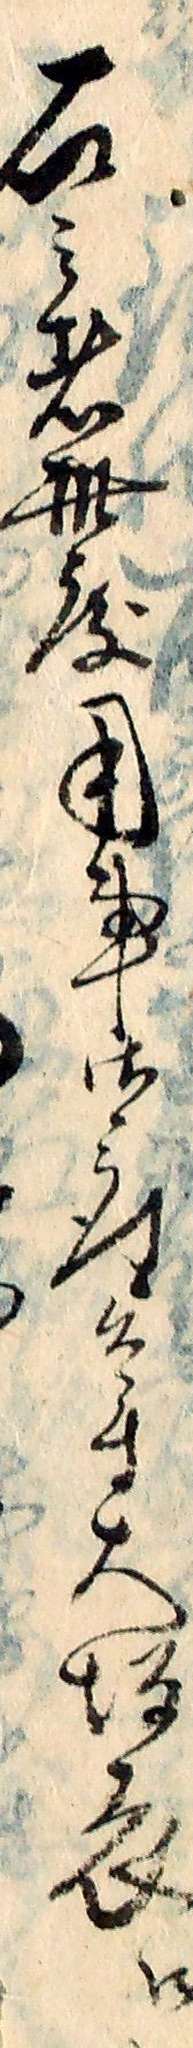右之者此度用事御座候に付大坂表え
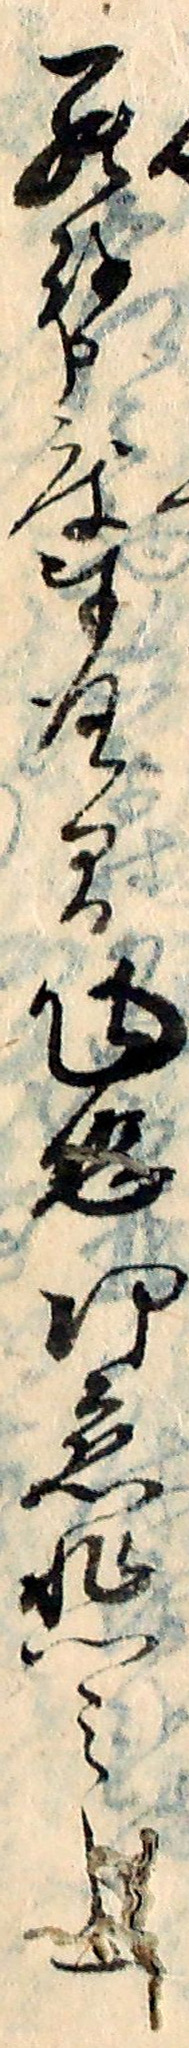罷越申度奉存候間乍恐御慈悲之上
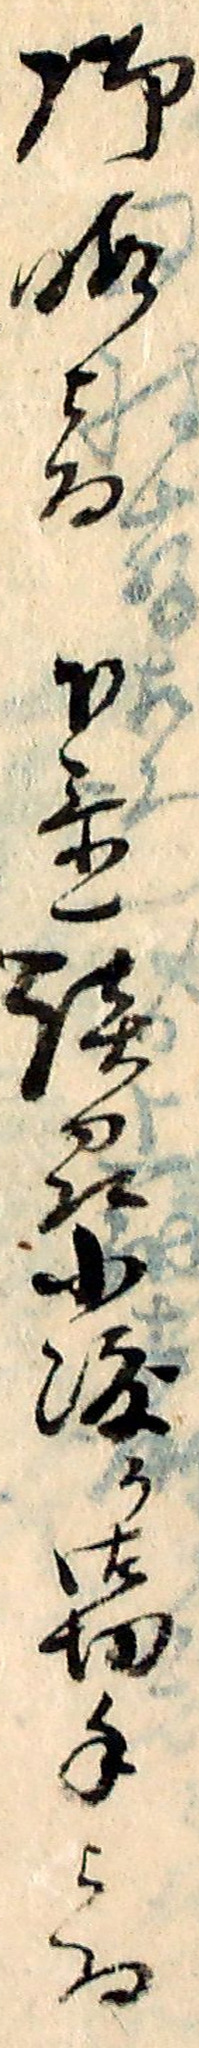御暇被為下置淡州小渡り御切手被為
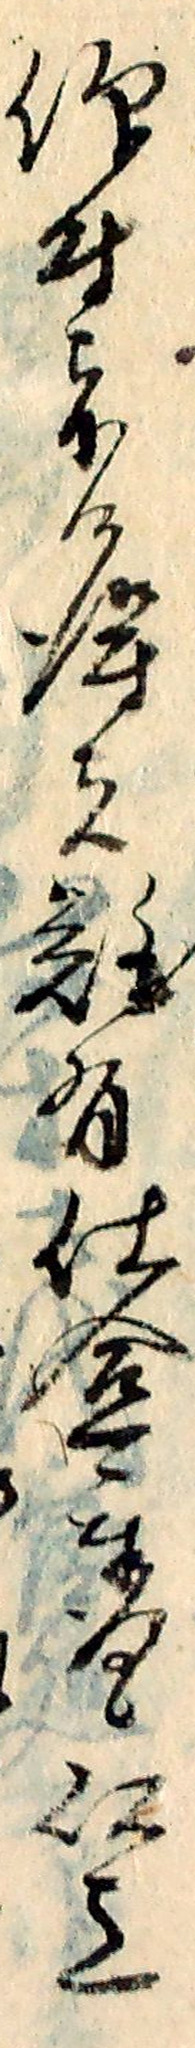仰付被下候得は難有仕合可奉存候以上
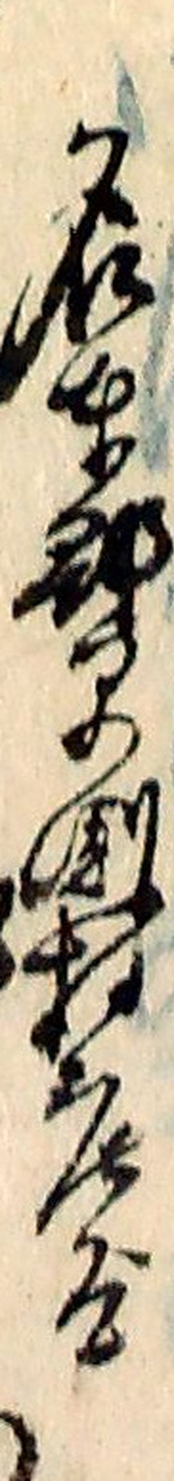名東郡早淵村庄屋
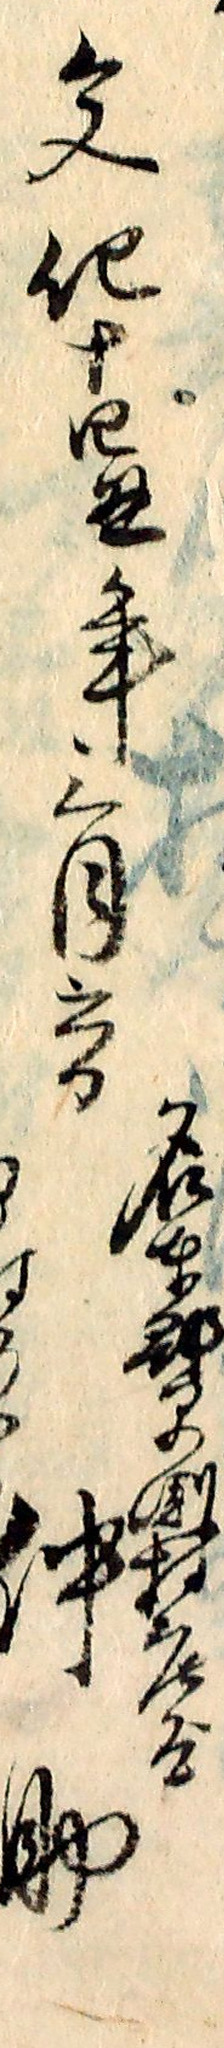文化十四丑年三月六日仲助
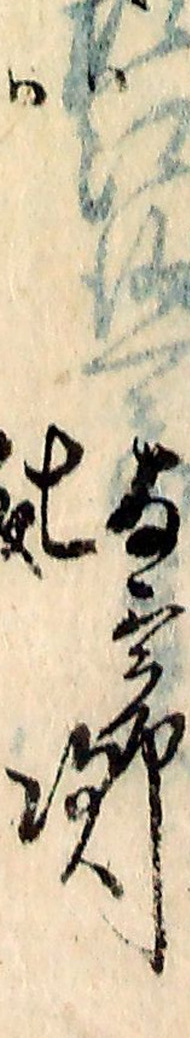与三郎
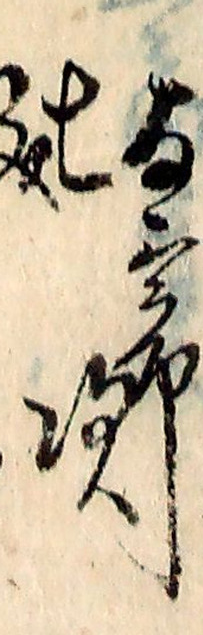与三郎
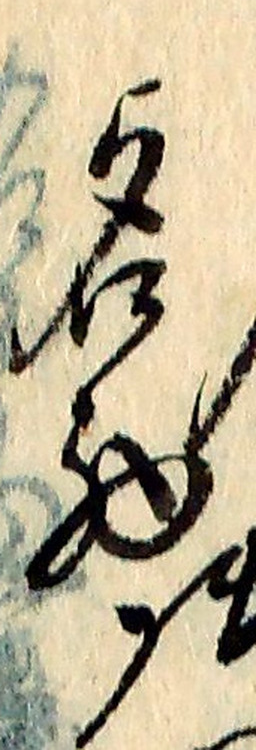名西郡
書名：諸御願書控(後藤氏壱番）
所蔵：鳴門教育大学 Naruto University of Education
